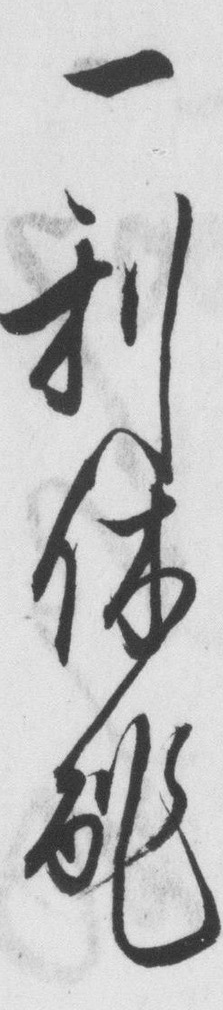一利休酢
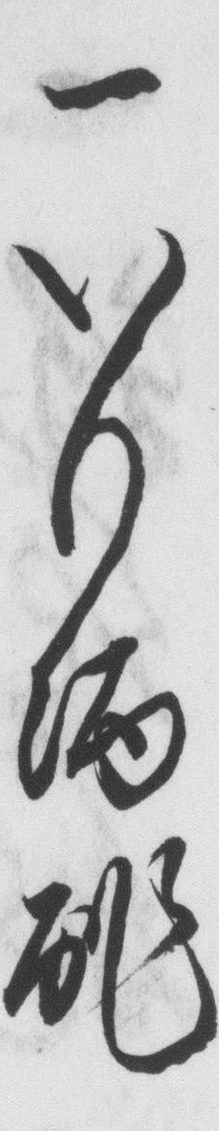一いり酒酢
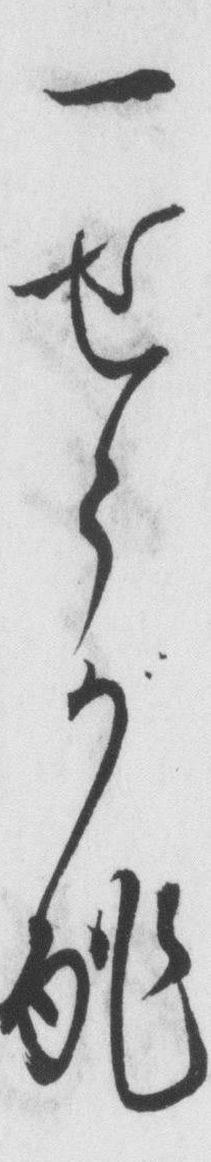一せうか酢
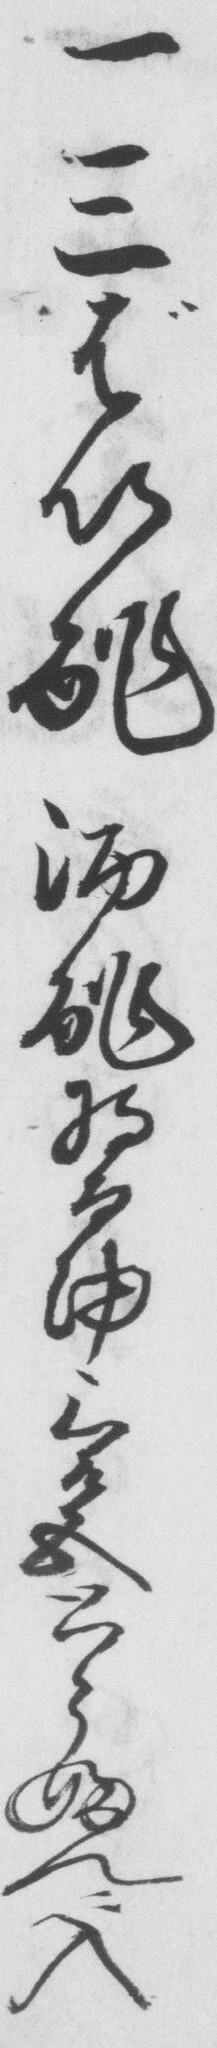一三ばいす酒酢醤油とうふんニ入

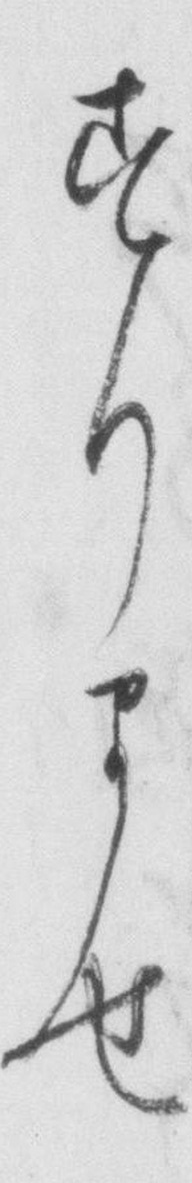すりませ
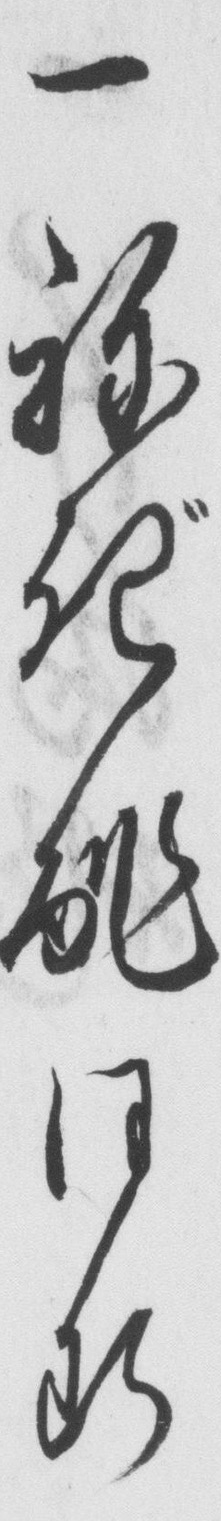一ねぎ酢同段
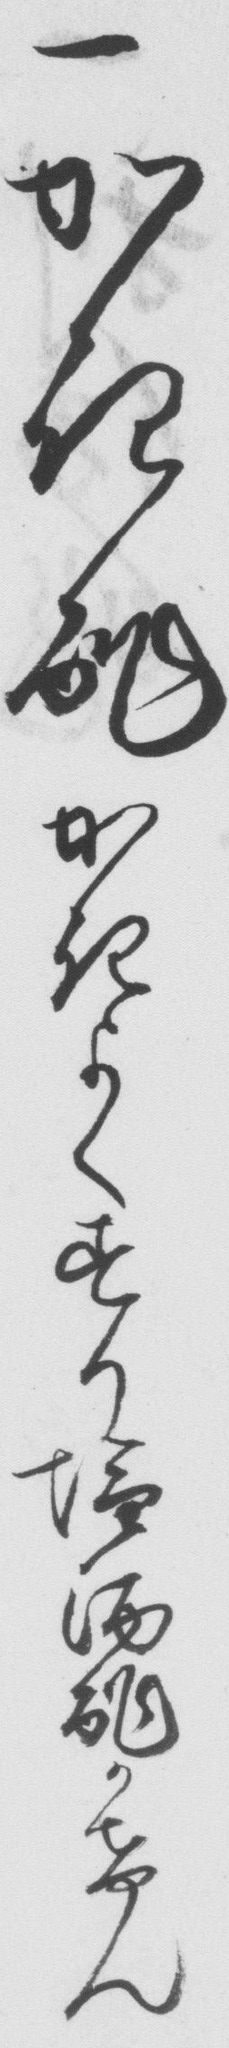一かき酢かきよくすり塩酒かけん
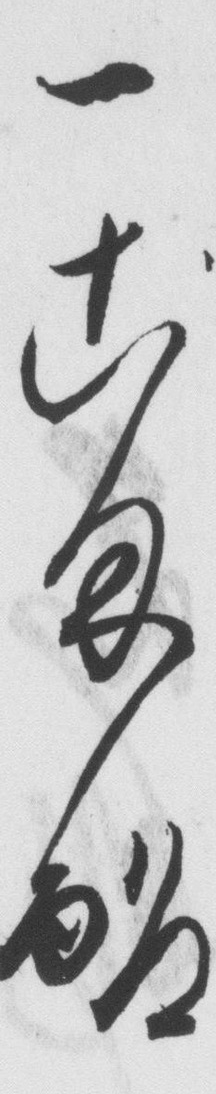一ごま酢

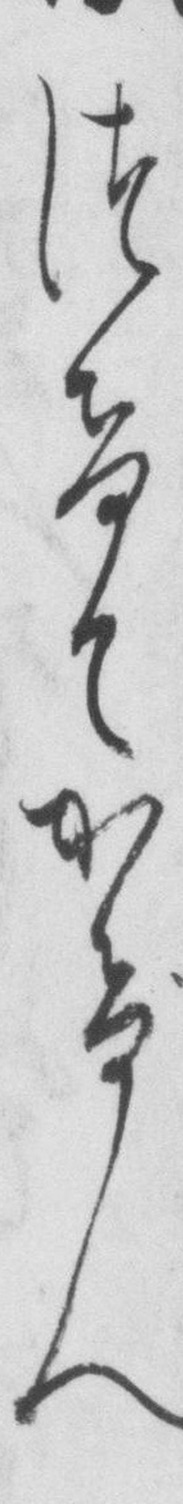つけてかげん
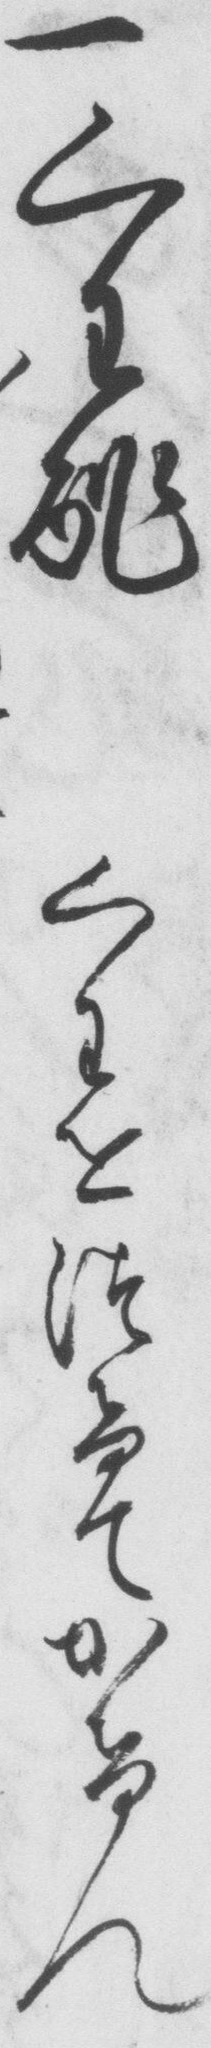一くわ酢くわをつけてかけん
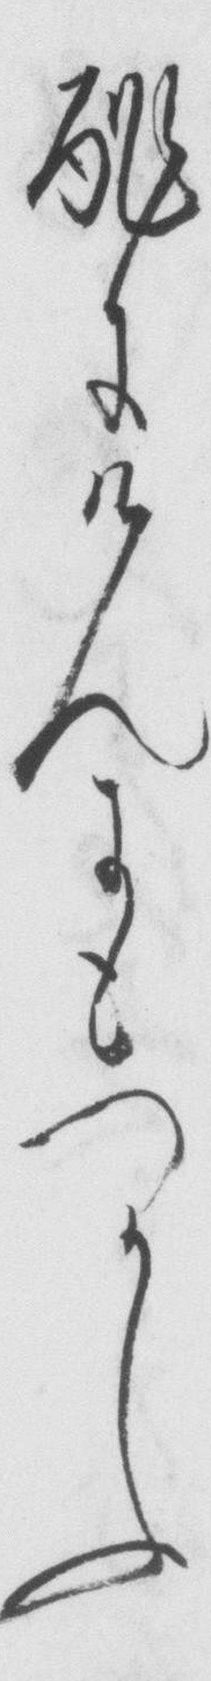酢にけんにもつかふ
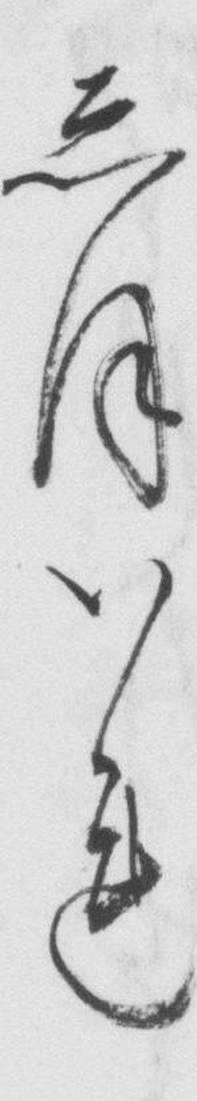しほいれ
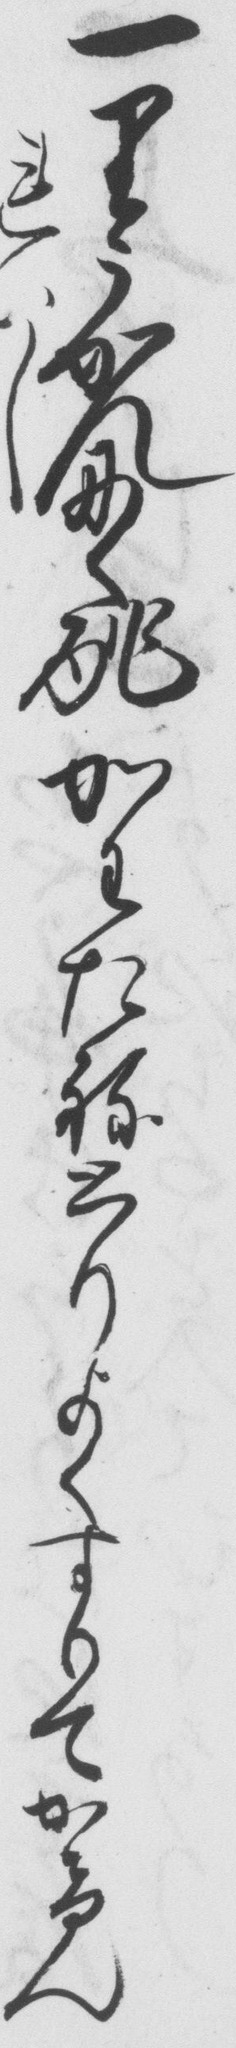一りうかんに酢かわたねとりよくすりてかけん
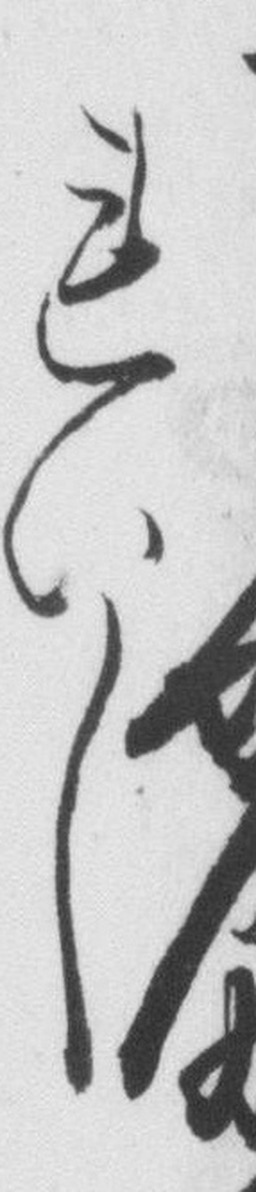れいし
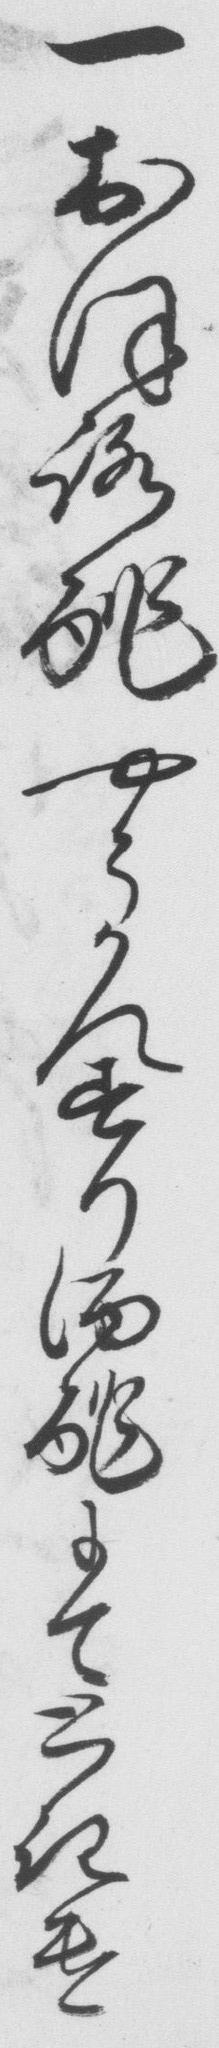一おほろ酢やうかんすり酒酢にてとき遣
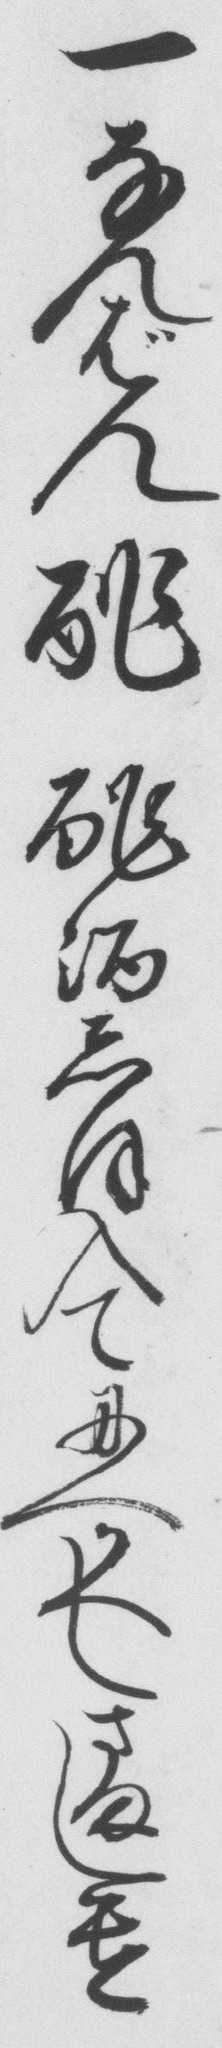一なんばん酢酢酒しほ入てにへかへしさまし遣
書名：料理筌
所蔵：大阪府立大学学術情報センター 国文学研究資料館
